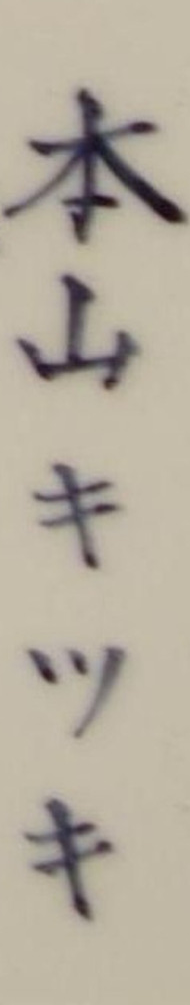本山キツキ
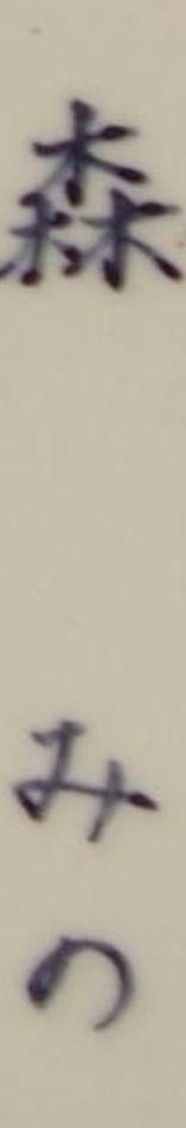森みの
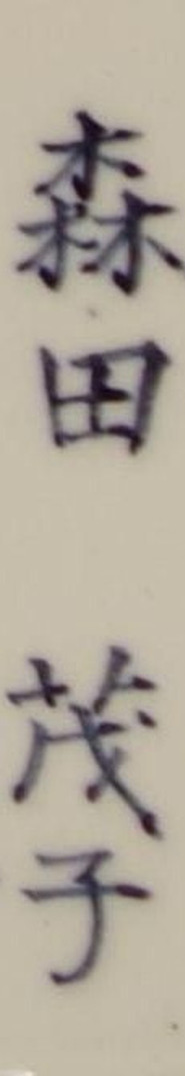森田茂子
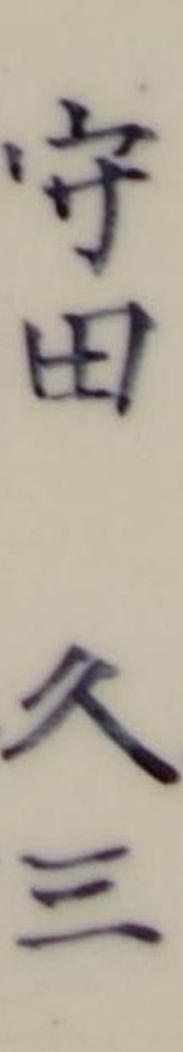守田久三
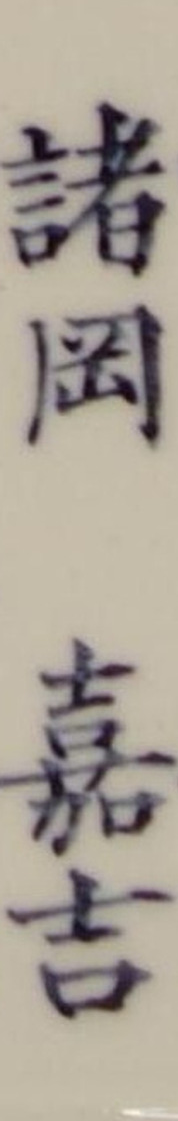諸岡嘉吉
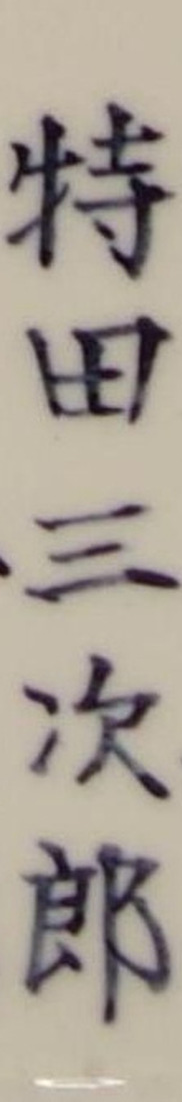特田三次郎
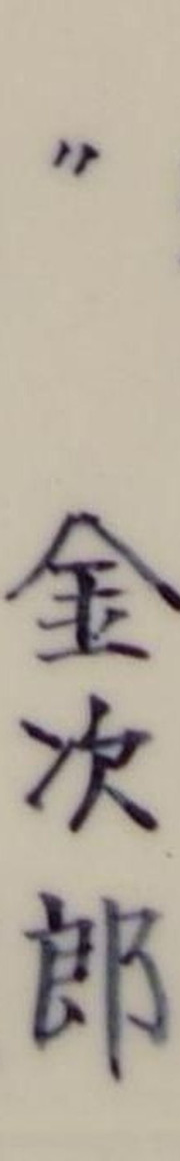金次郎
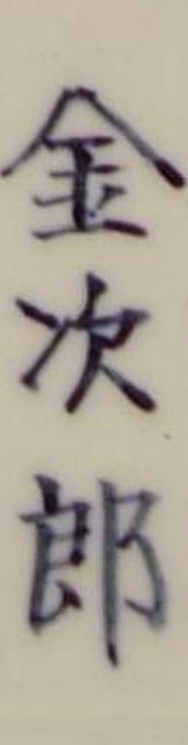金次郎
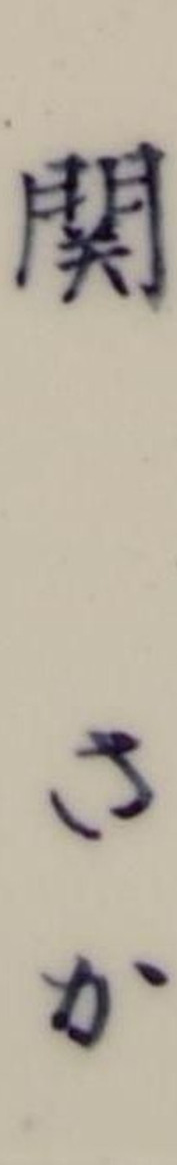関さか
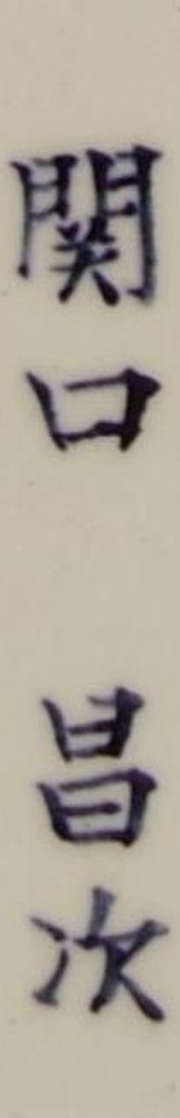関口昌次
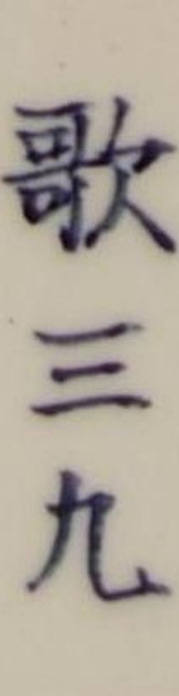歌三九
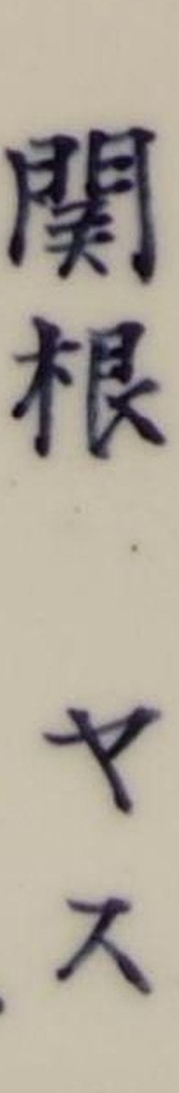関根ヤス
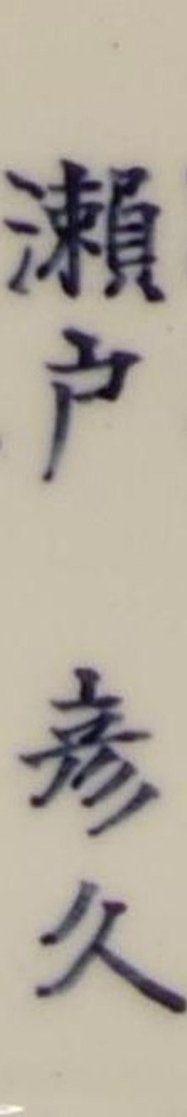瀬戸彦久
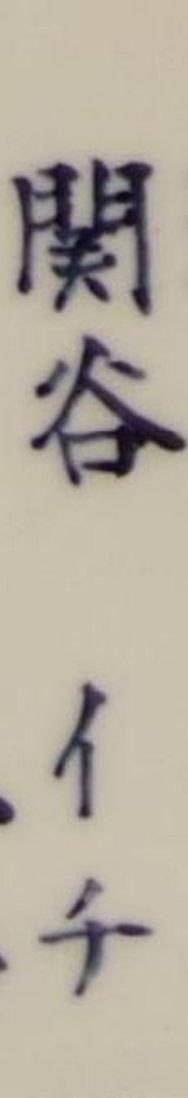関谷イチ
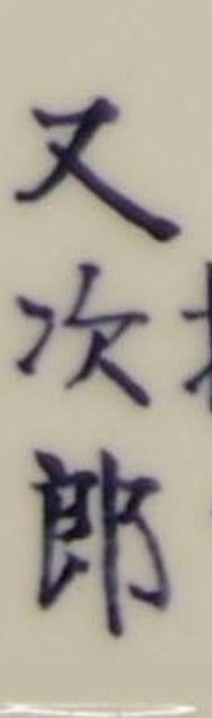又次郎
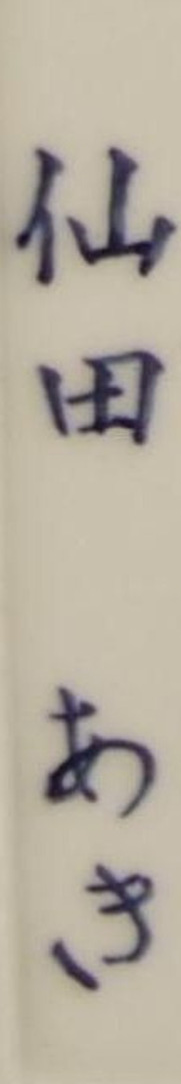仙田あき
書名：E~L
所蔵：高野山金剛峯寺
